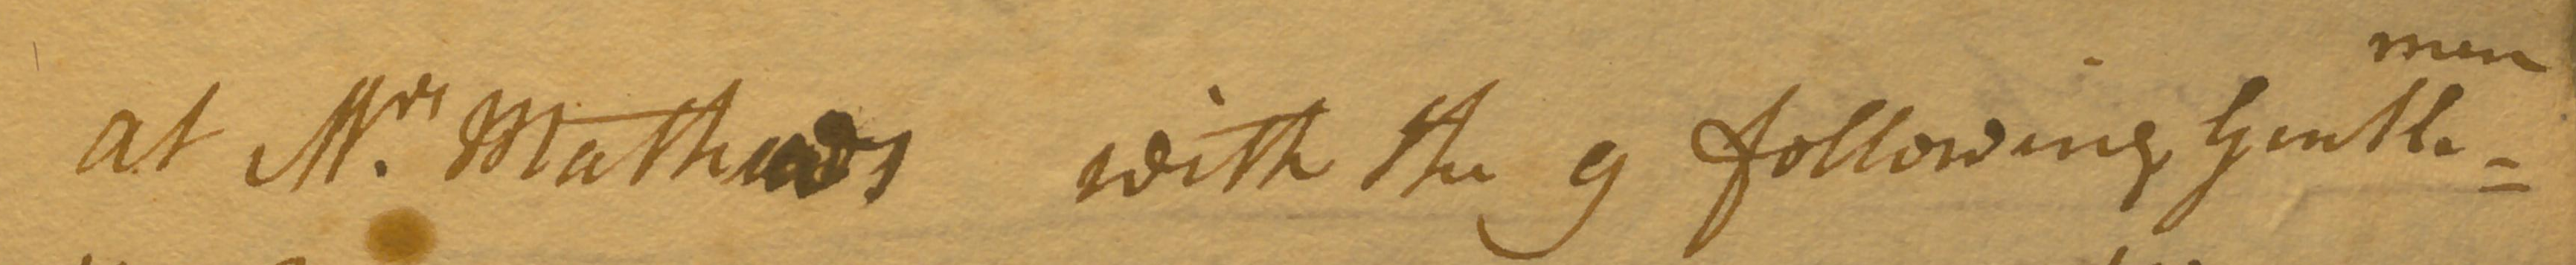at M^rs. Mathews with the 9 following Gentle-
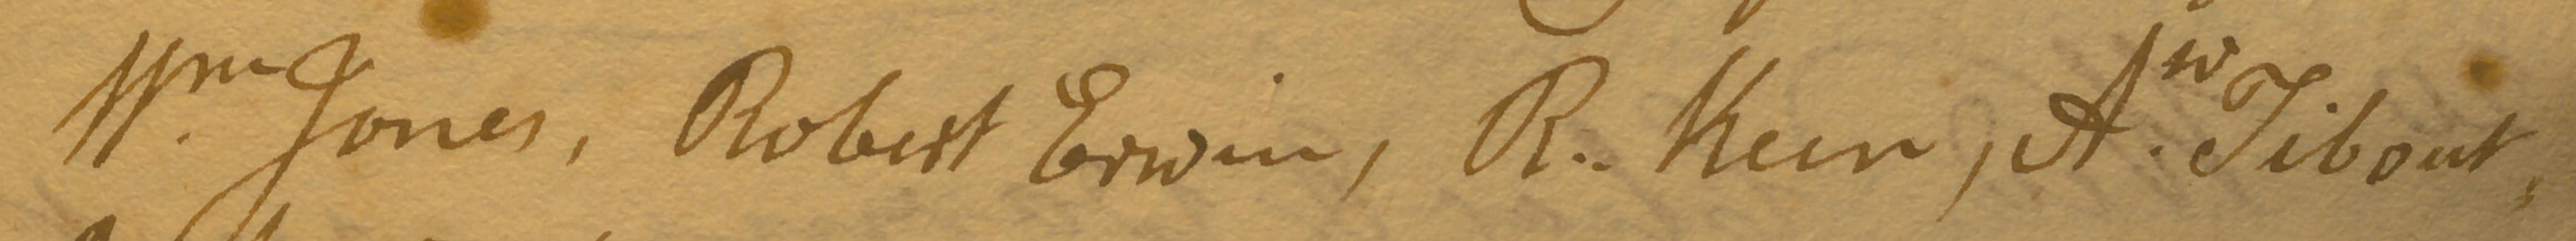W^m. Jones, Robert Erwin, R. Kun, A^w. Tibout
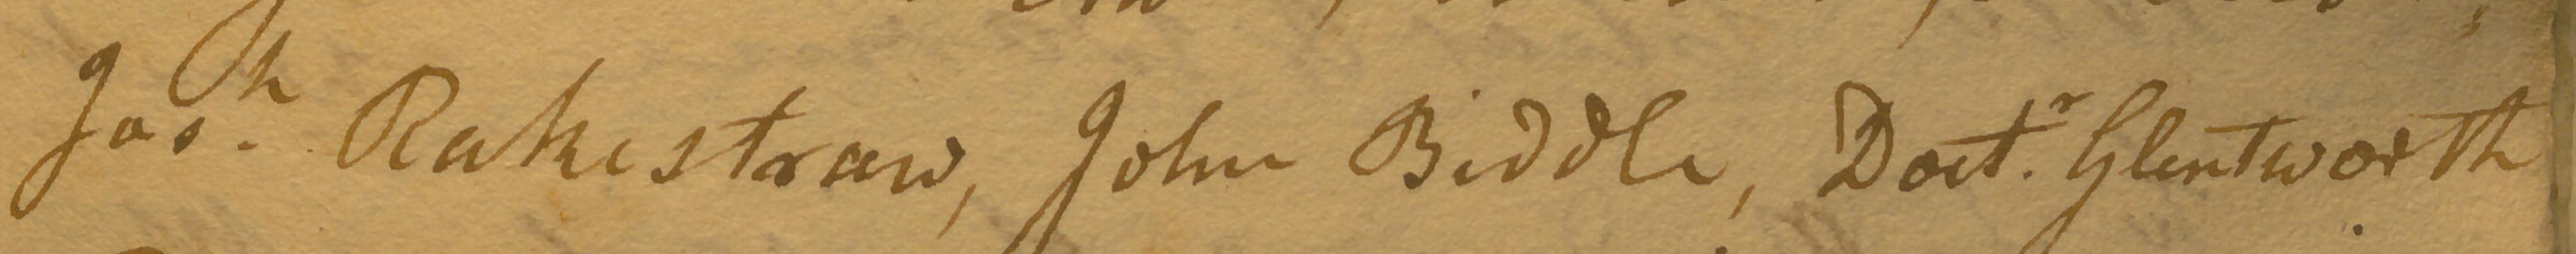Jas^h. Rakestraw, John Biddle, Doct^r. Glentworth
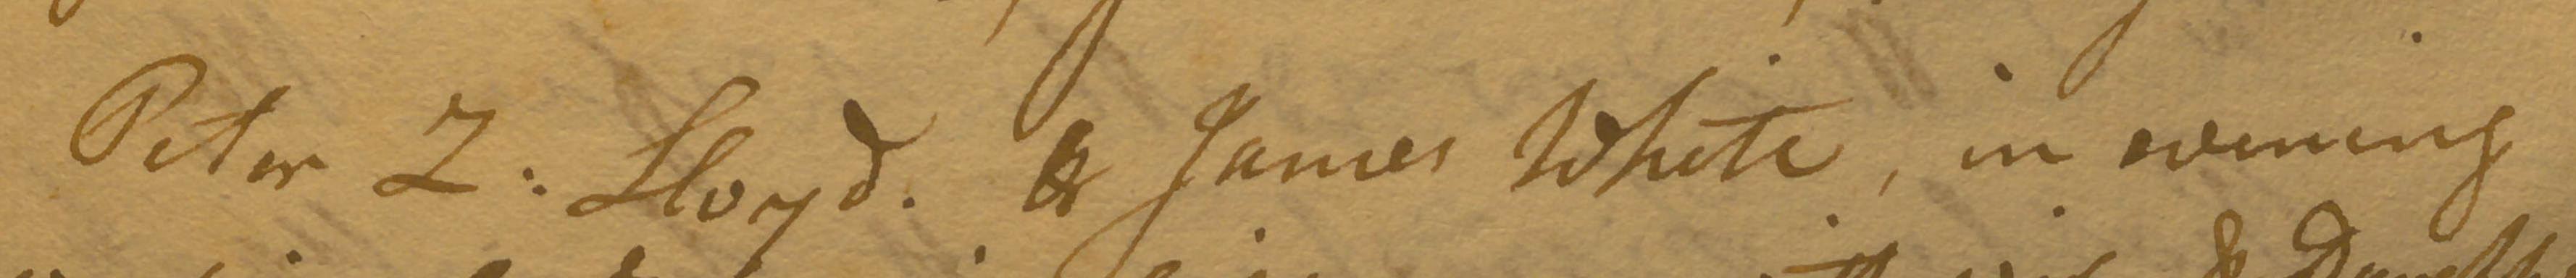Peter Z: Lloyd. & James White, in evening
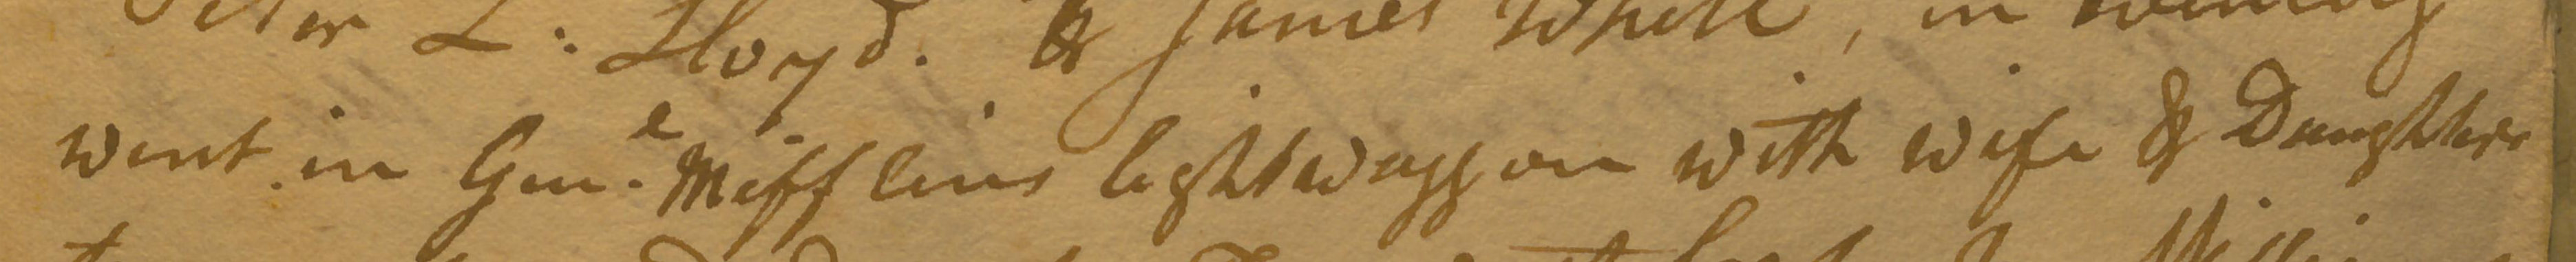went in Gen^l. Mifflens lightwaggon with wife & Daughter
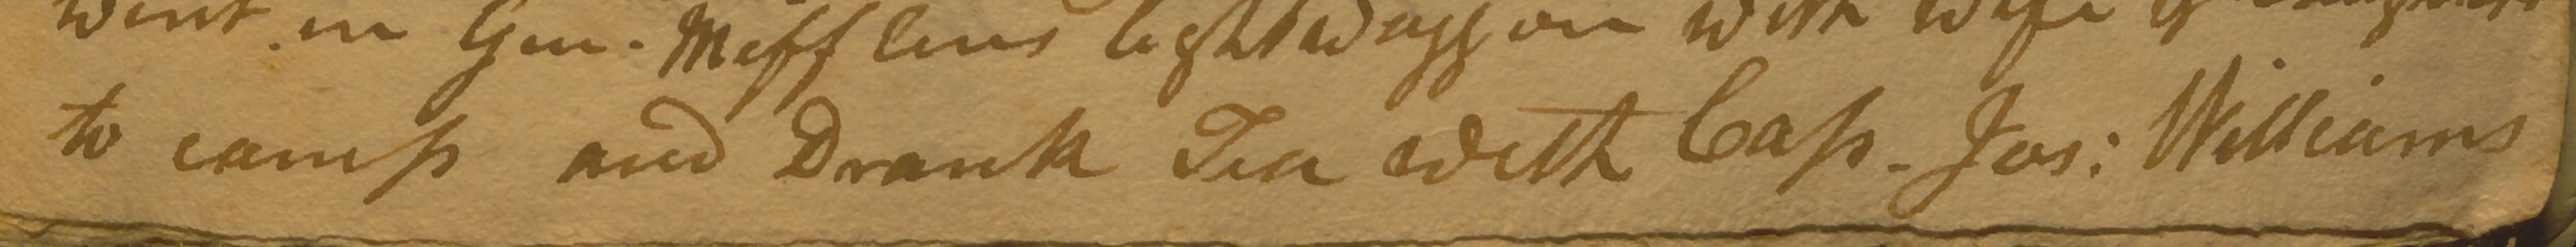to camp and Drank Tea with Cap. Jas: Williams
